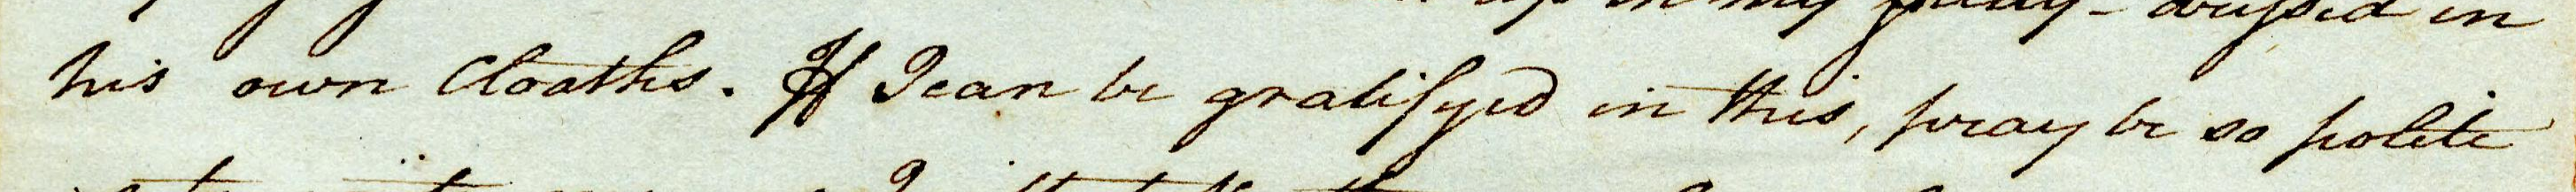his own Cloaths. If I can be gratifyed in this, pray be so polite
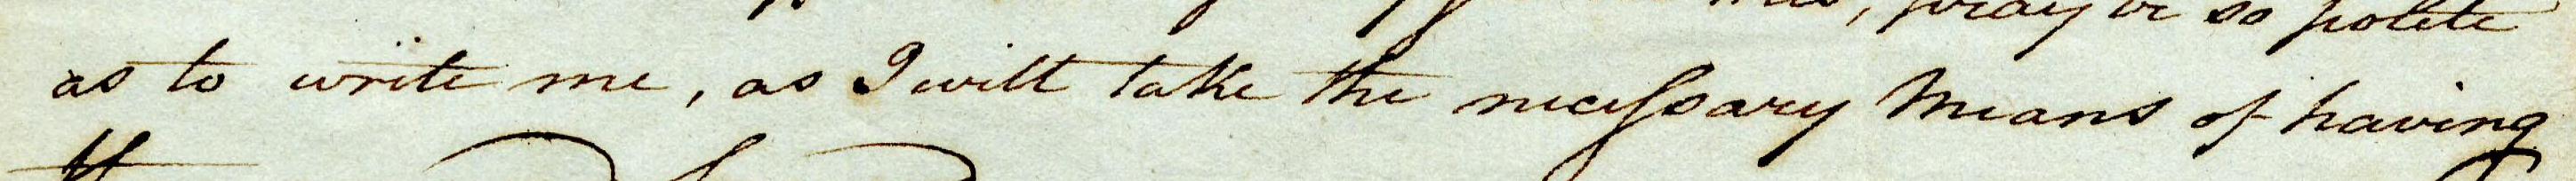as to write me, as I will take the necessary Means of having
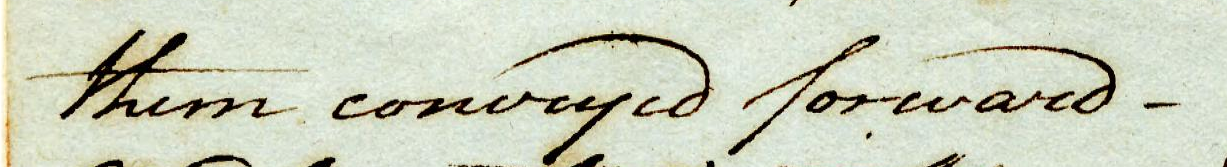them conveyed forward-
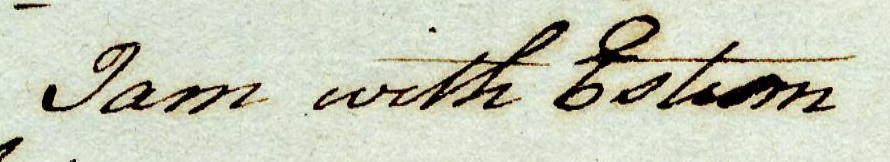I am with Esteem
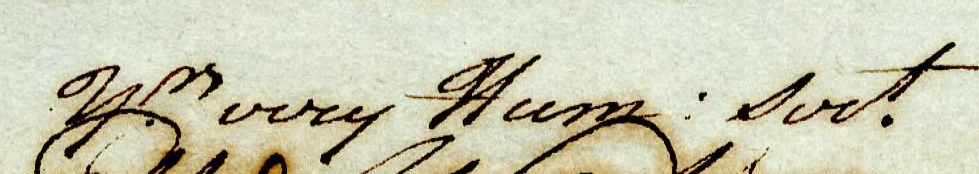y^r. very Hum: ser^t.
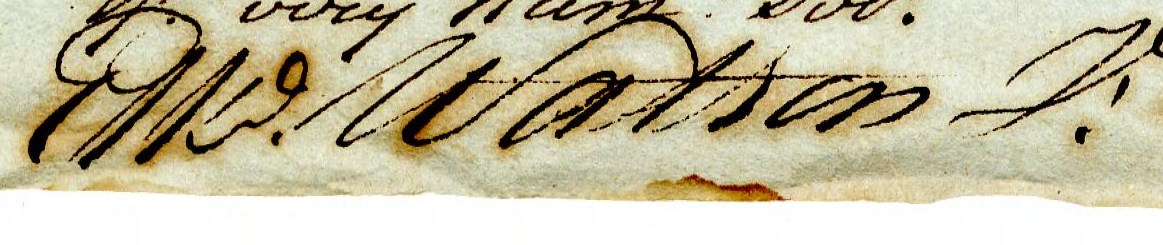Elk^h. Watson J^r.
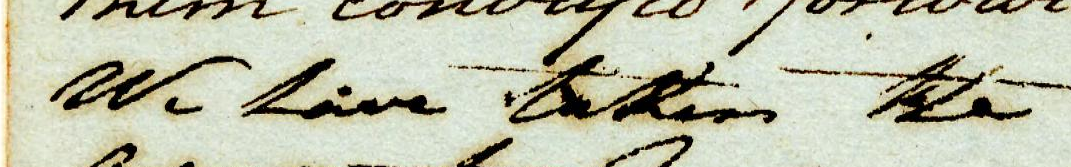We have taken the
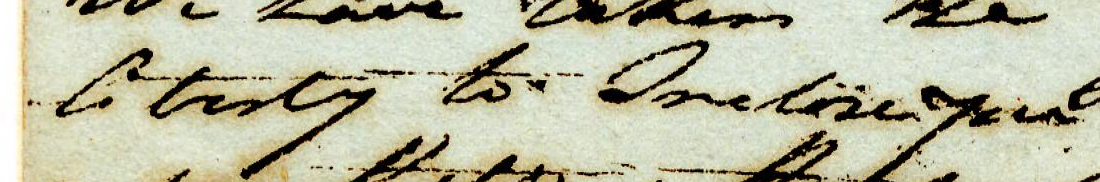liberty to Inclose you
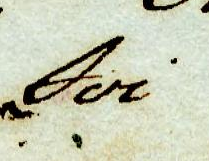Sir
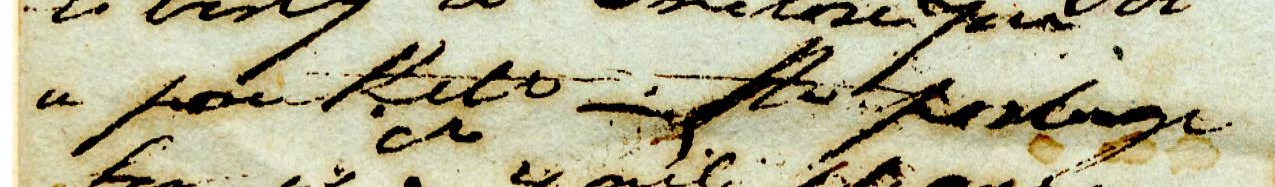a packett- the postage
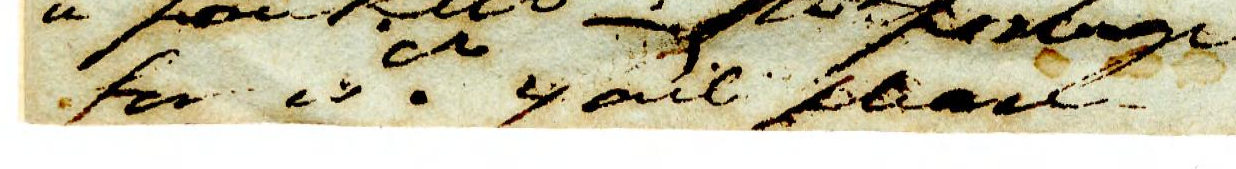for w^ch. you'l please
